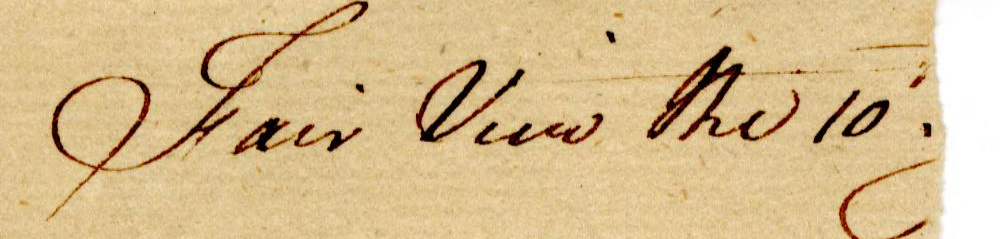Fair View the 10
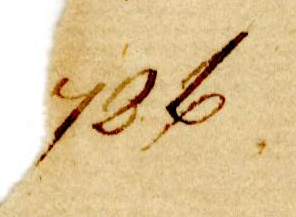786
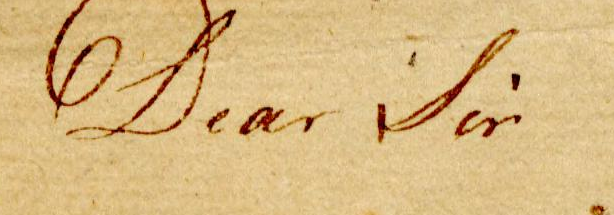Dear Sir
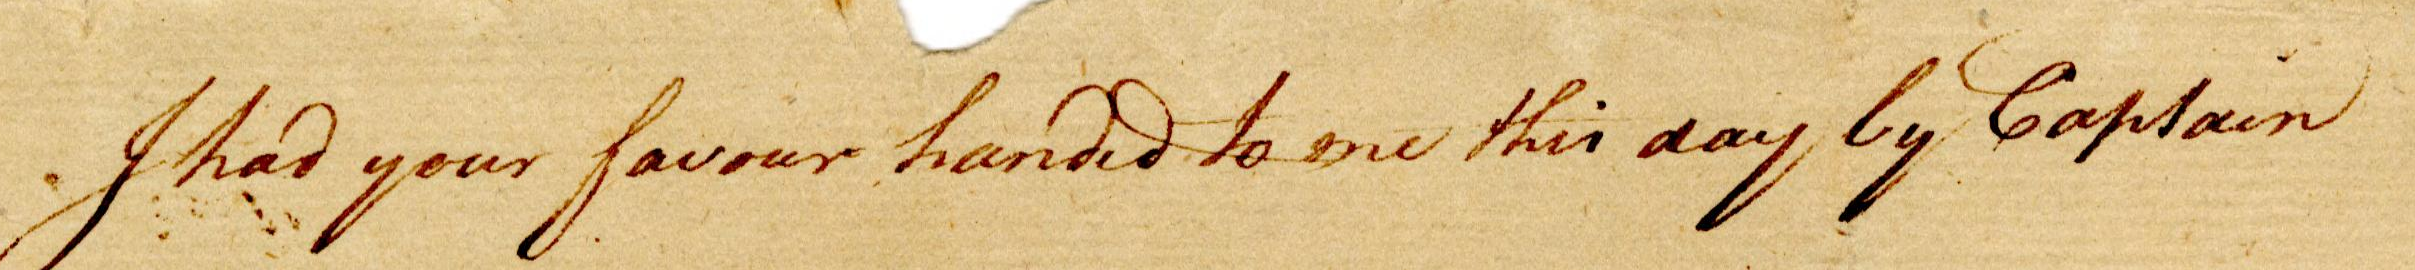I had your favour handed to me this day by Captain
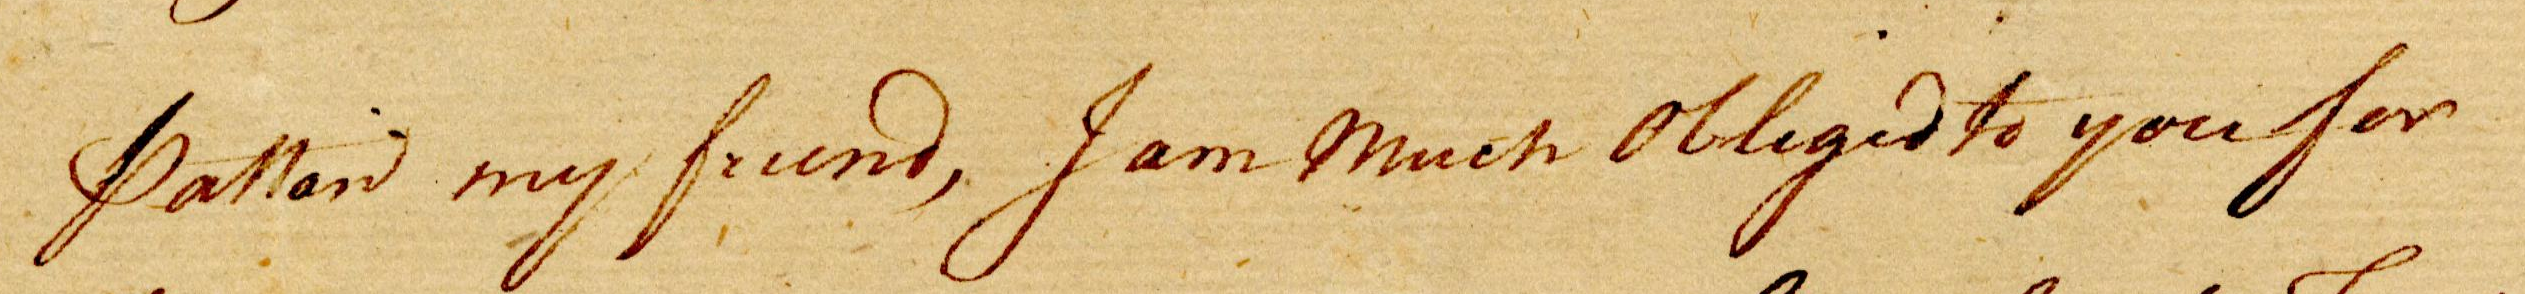Patton my friend, I am much obliged to you for
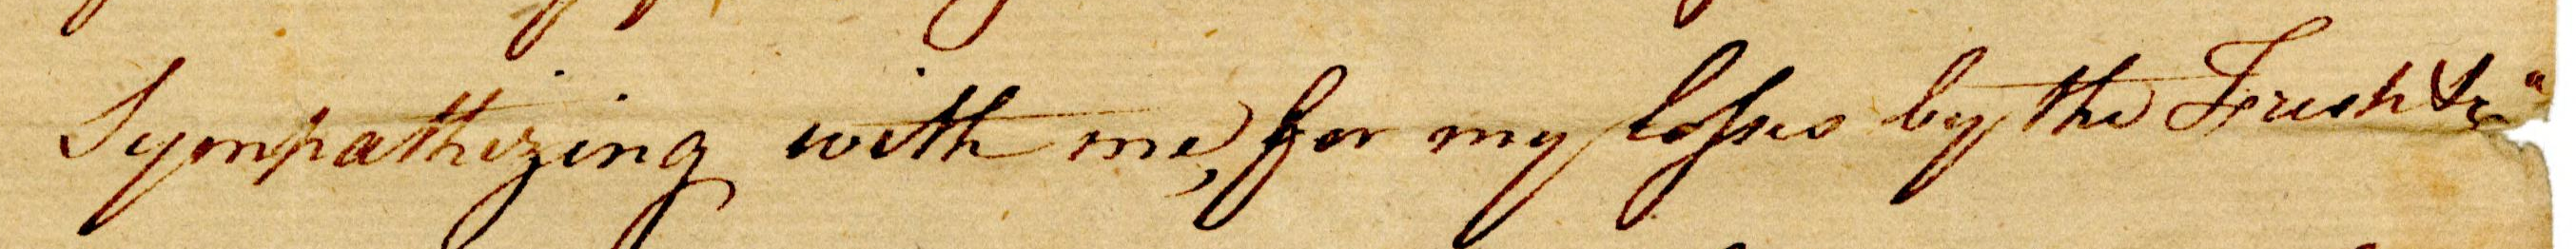Sympathizing, with me for my losses by the Fush &c
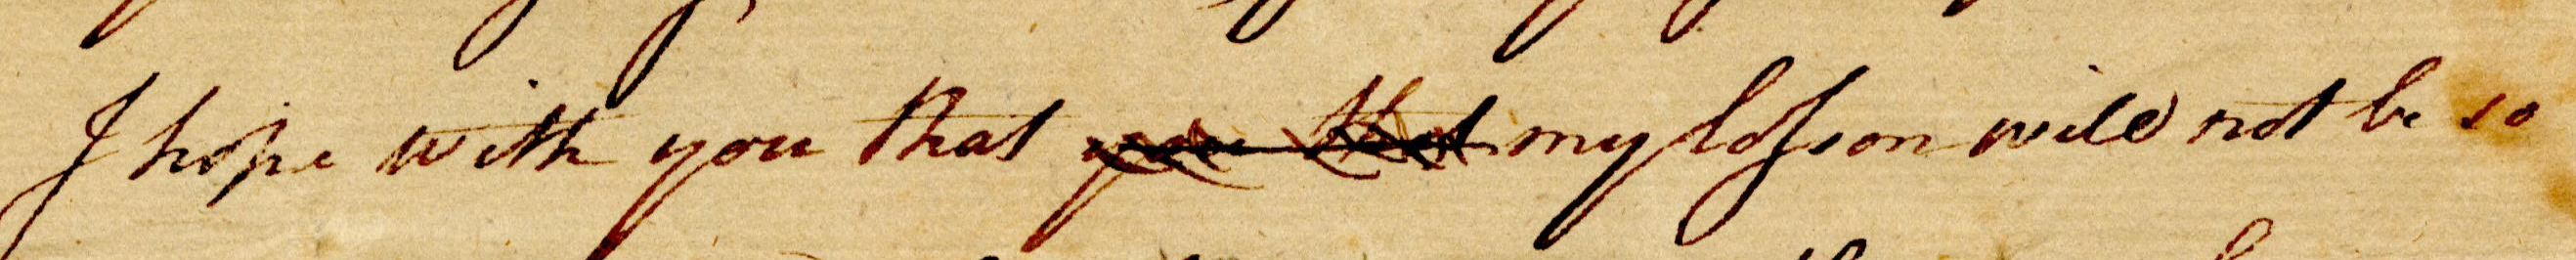I hope with you that [you] [that] my losson will not be so
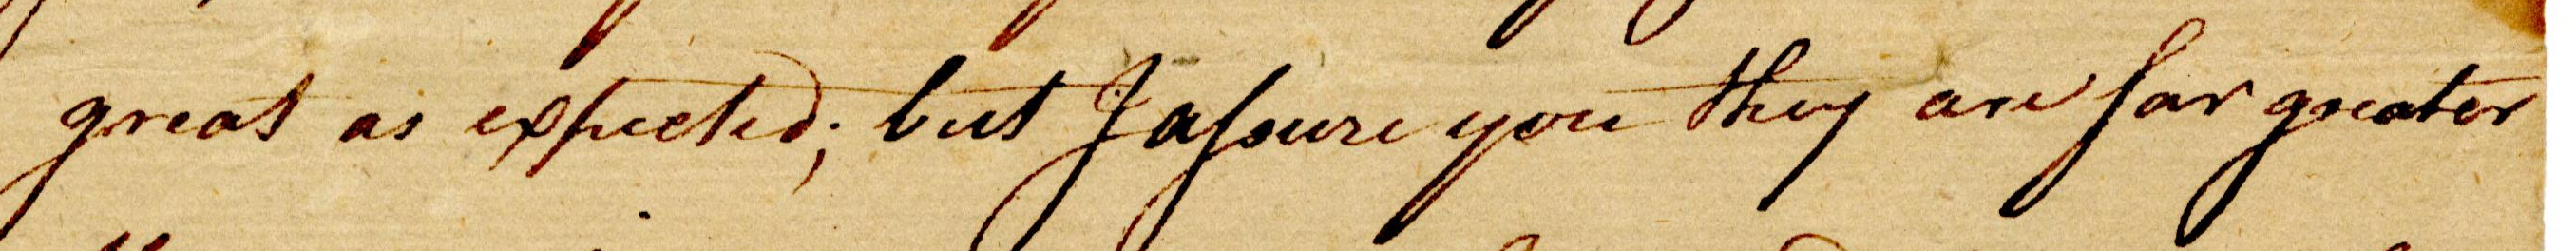great as expected, but I assure you they are far greater
